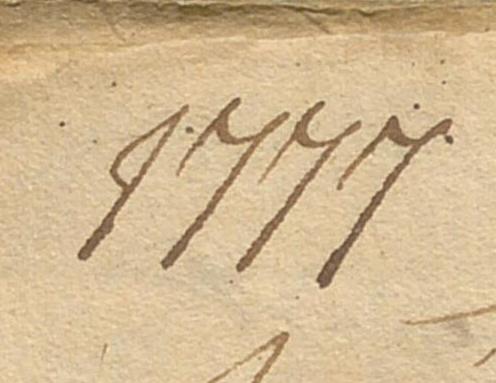1777
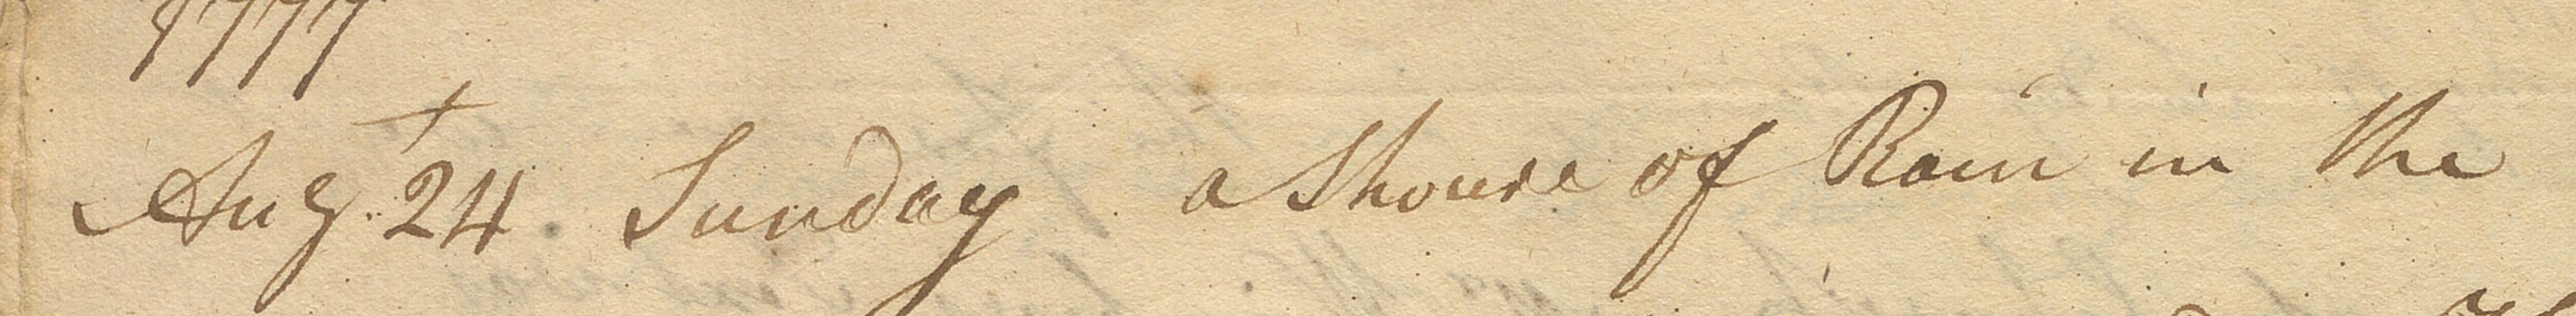Aug^t. 24. Sunday a Shoure of Rain in the
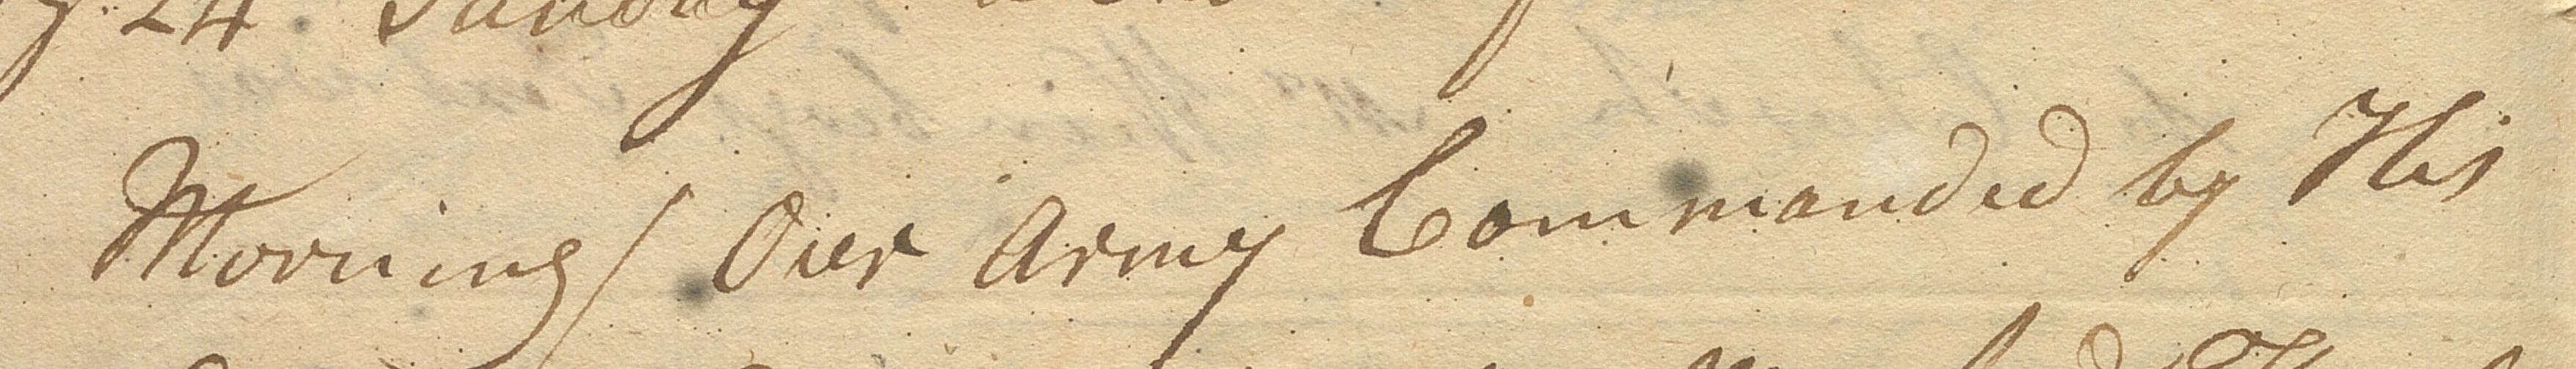Morning / our Army Commanded by His
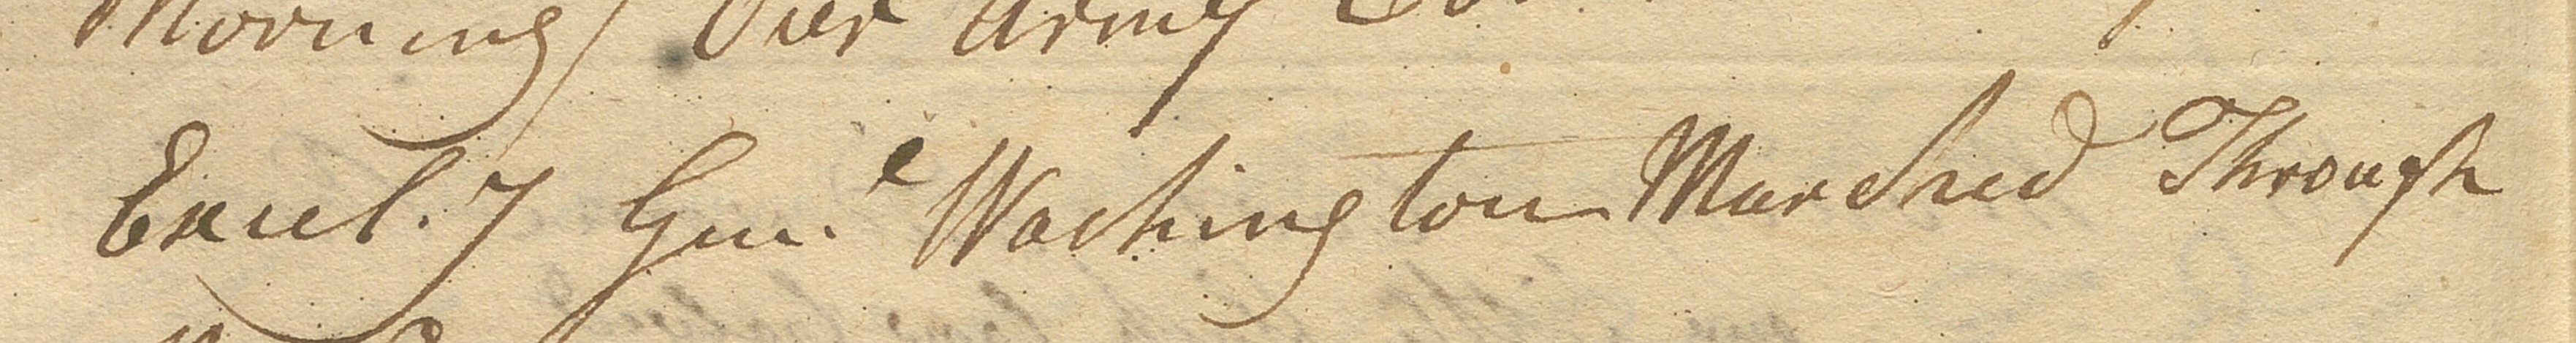Excel^y. Gen^l. Washington Marched Through
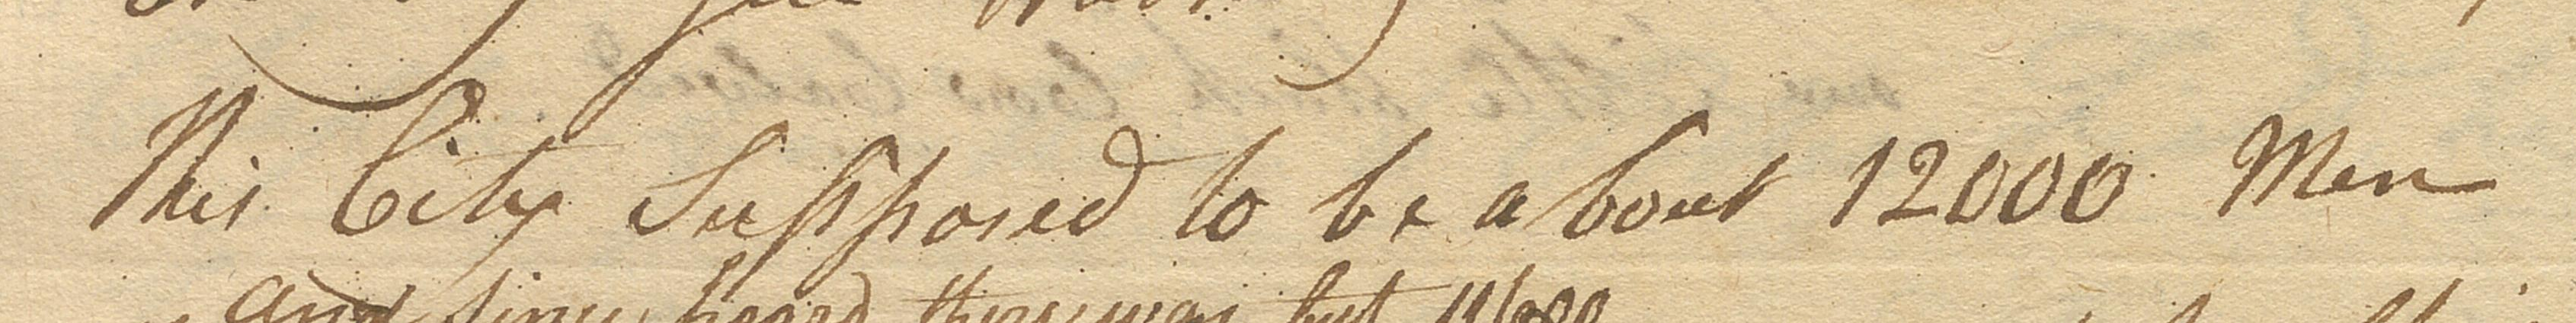this City Supposed to be about 12000 Men
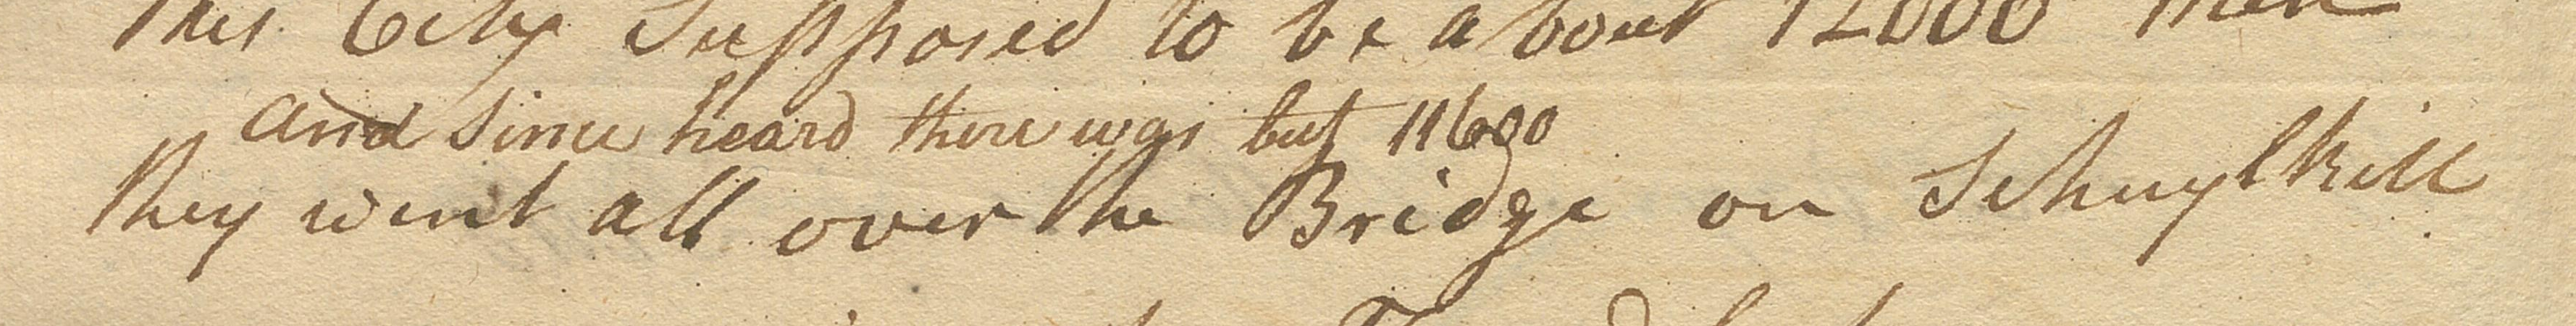they went all over the Bridge on Schuylkill
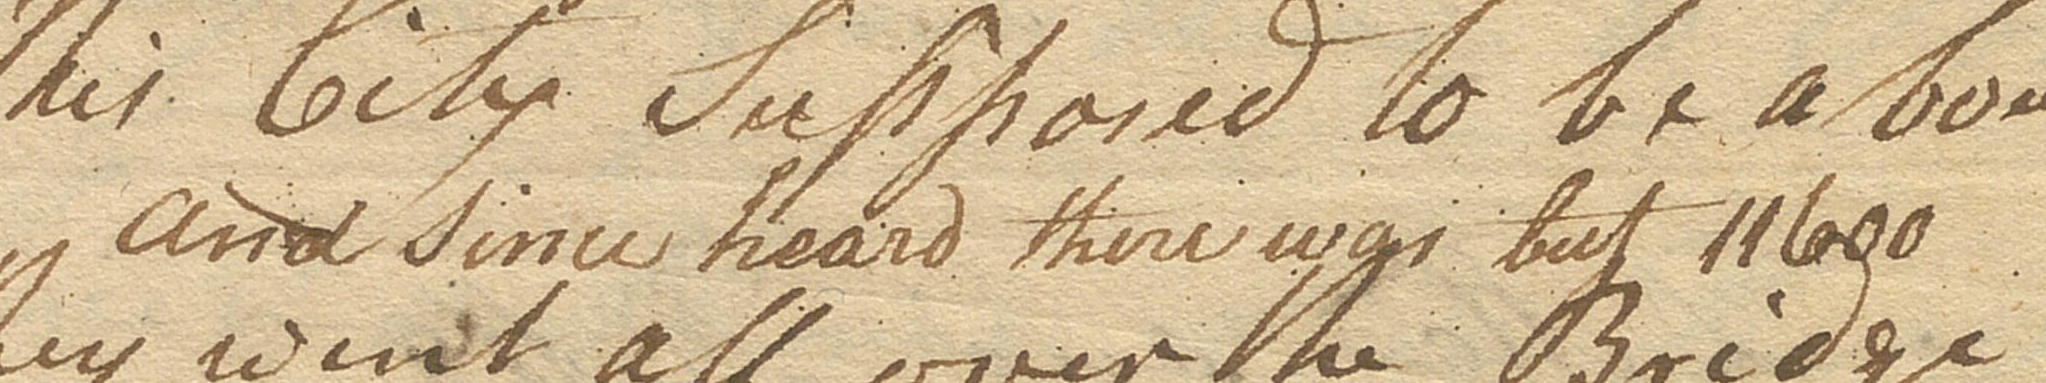And Since heard there was but 11600
